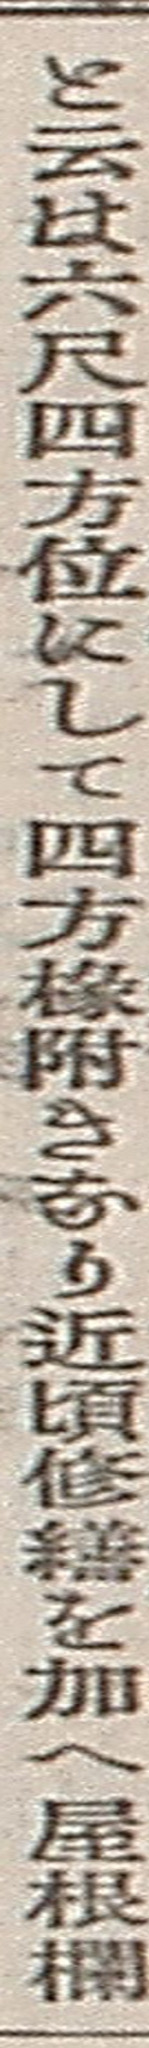と云は六尺四方位にして四方椽附きなり近頃修繕を加へ屋根欄
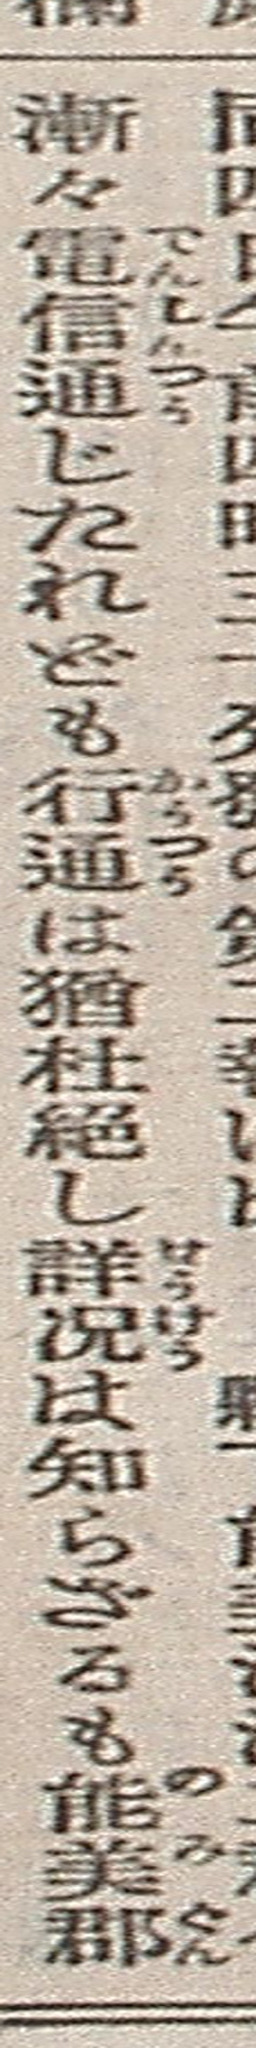漸々電信通じてれども行通は猶杜絶し詳況は知らざるも能美郡

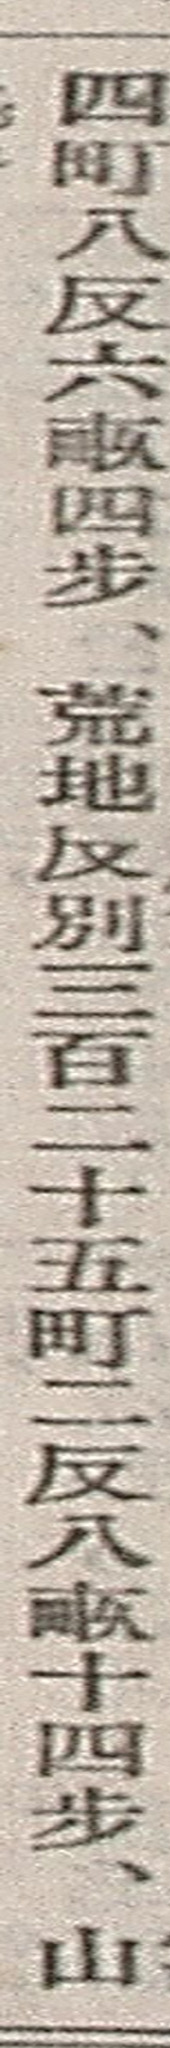町八反六畝四歩、荒地反別三百二十五町二反八畝十四歩、山
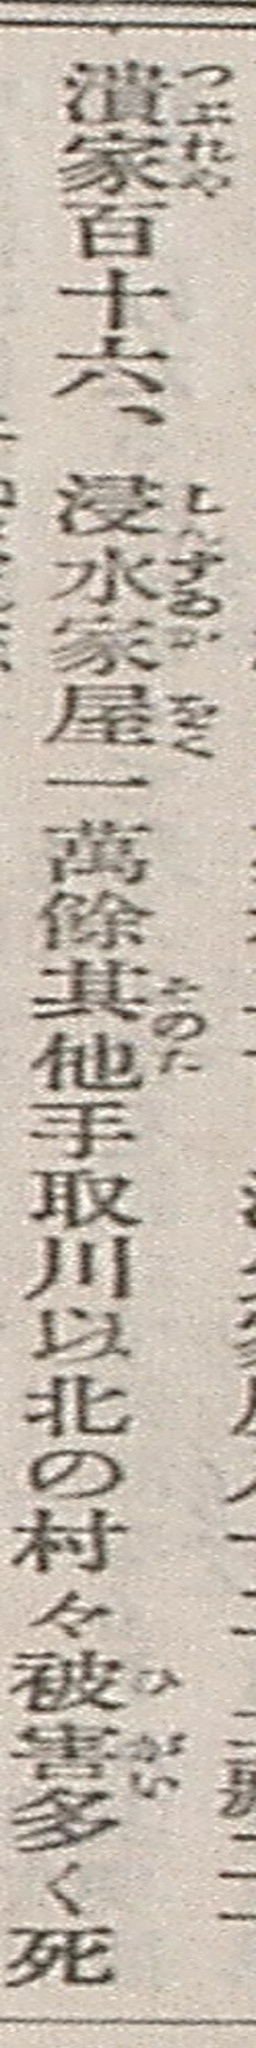潰家百十六、浸水家屋一万餘其他手取川以北の村々被害多く死
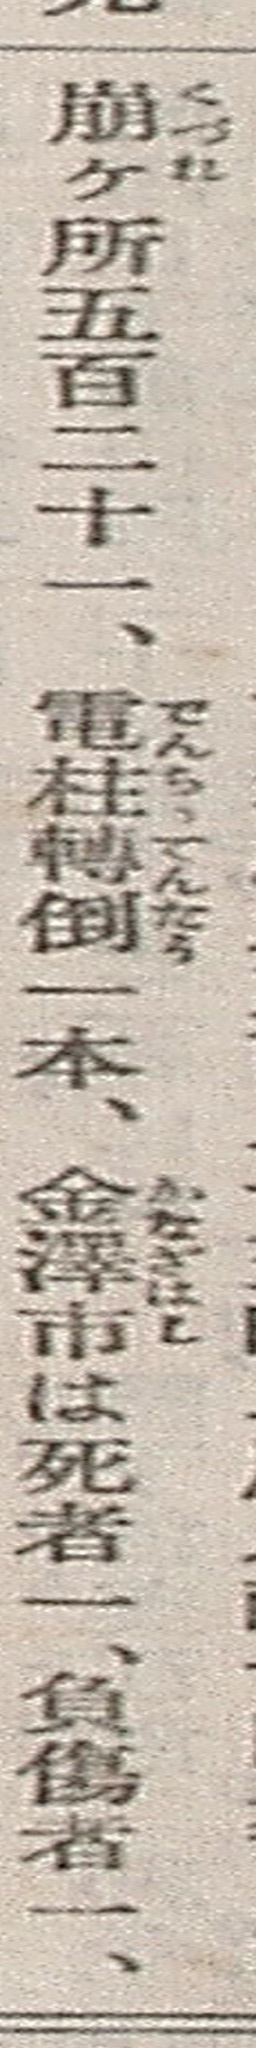崩ヶ所五百二十一、電柱転倒一本、金沢市は死者一、負傷者一、
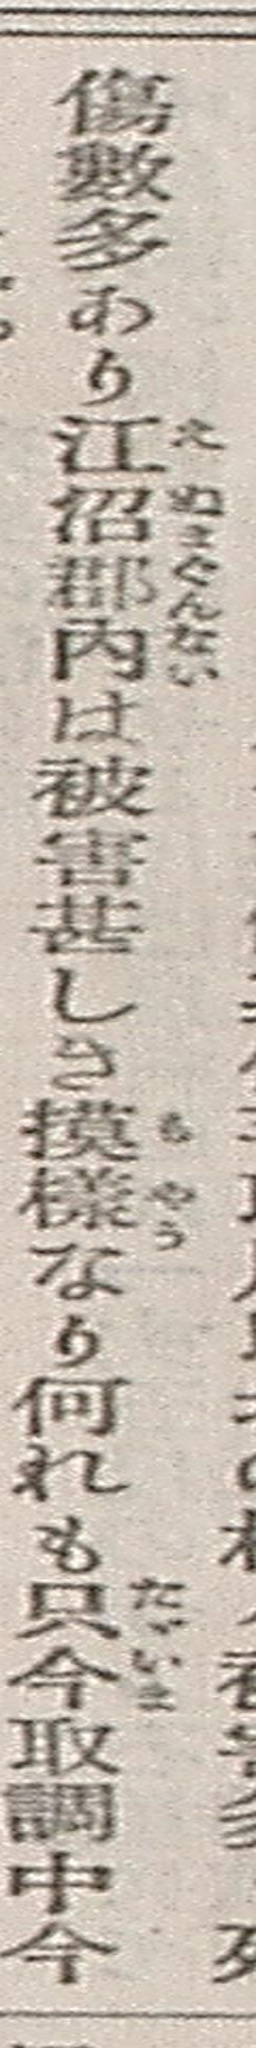傷数多あり江沼郡内は被害甚しき模様なり何れも只今取調中今
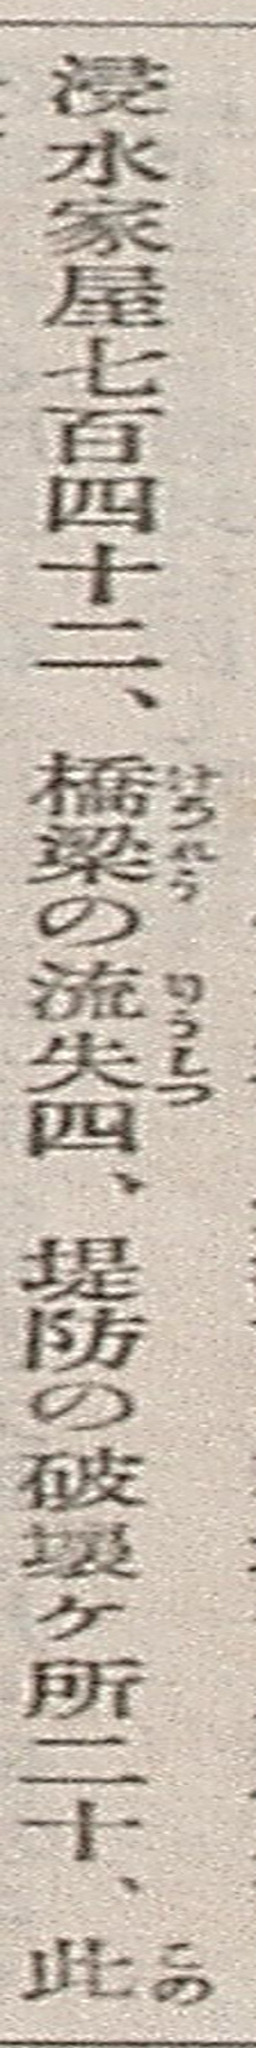浸水家屋七百四十二、橋梁の流失四、堤防の破壊ヶ所二十、此
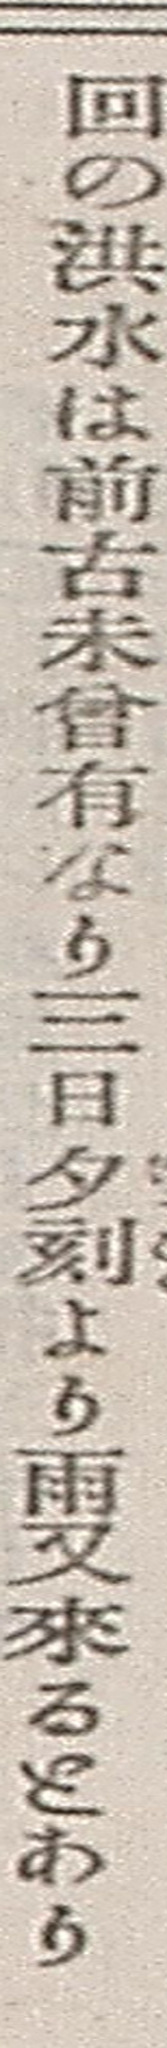回の洪水は前古未曾有なり三日夕刻より雨亦来るとあり
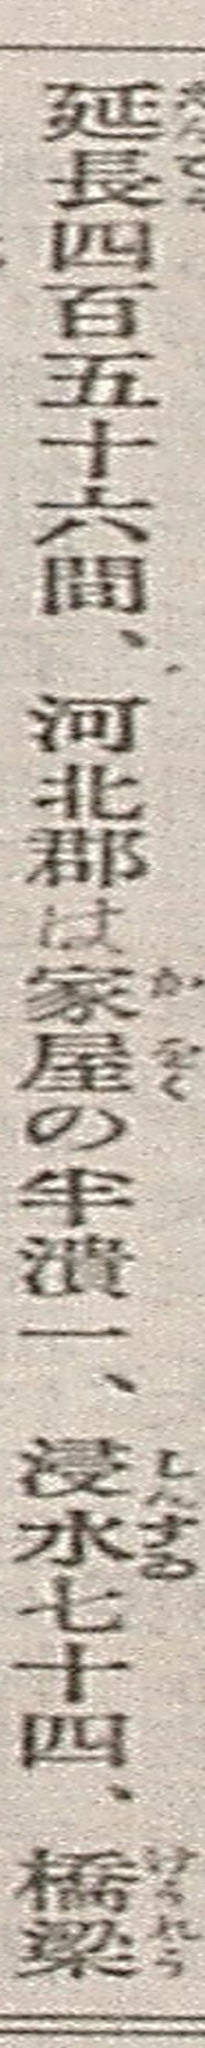延長四百五十六間、河北郡は家屋の半潰一、浸水七四、橋梁
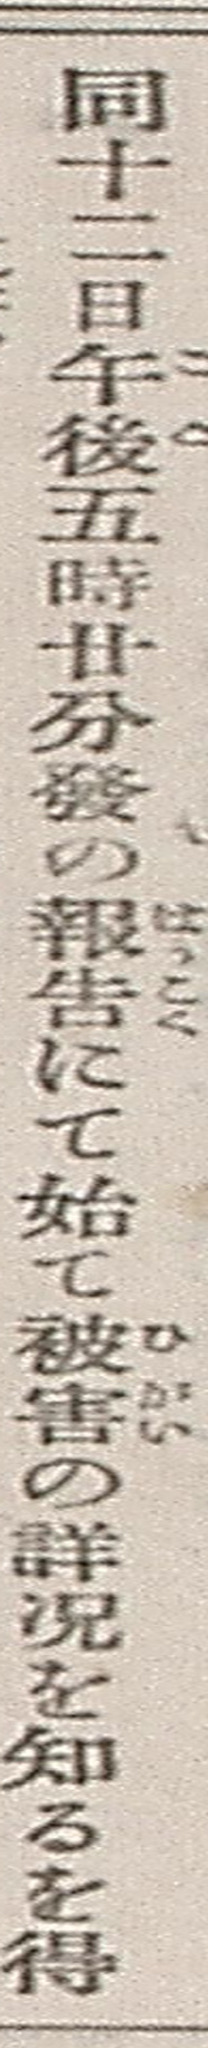同十二日午後五時廿分発の報告にて始て被害の詳況を知るを得
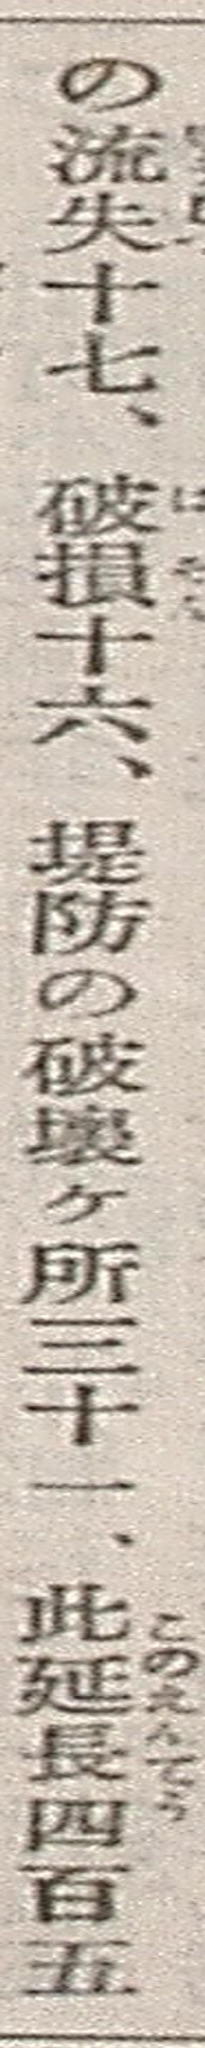の流失十七、破損十六、堤防の破壊ヶ所三十一、此延長四百五
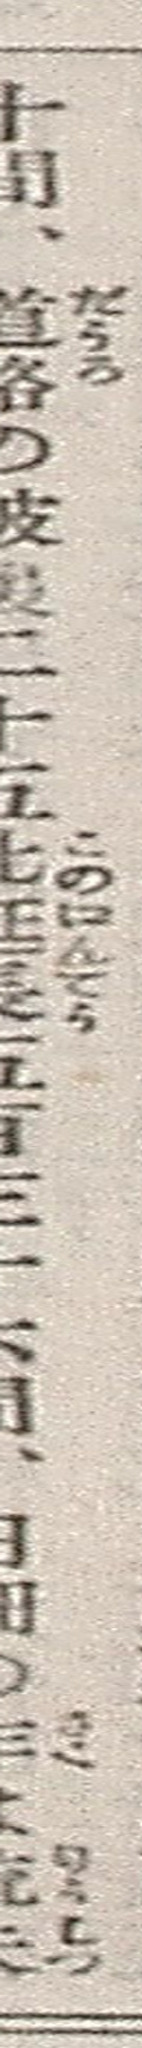十間、道路の破壊二十五此延長五百三十六間、田畑の作は流失
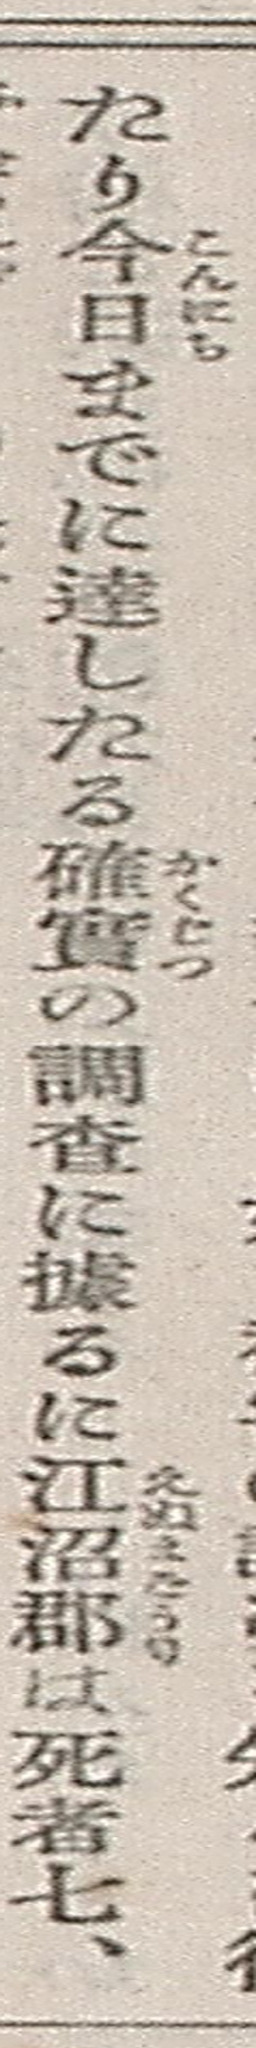たり今日までに達したる確実の調査に據るに江沼郡は死者七、
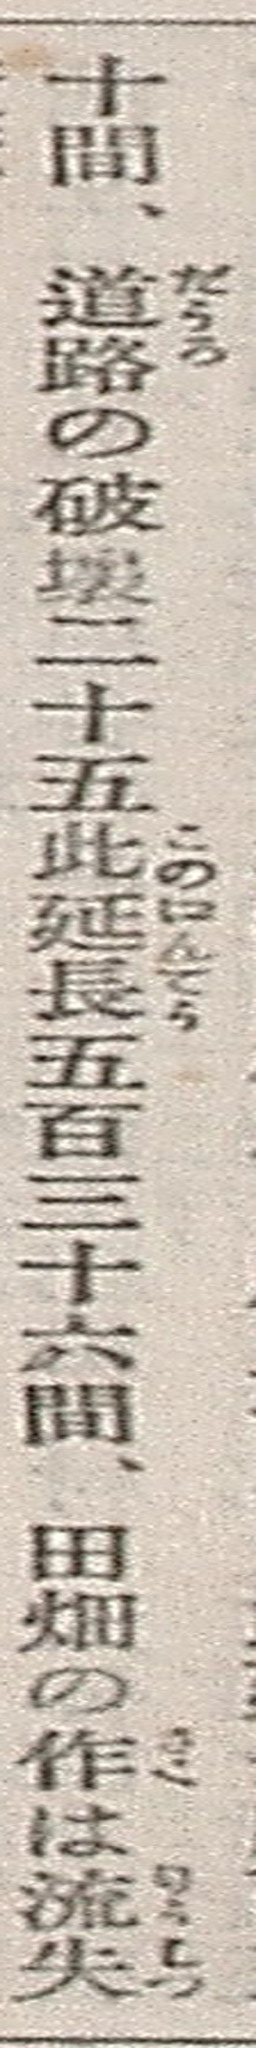十間、道路の破壊二十五此延長五百三十六間、田畑の作は流失
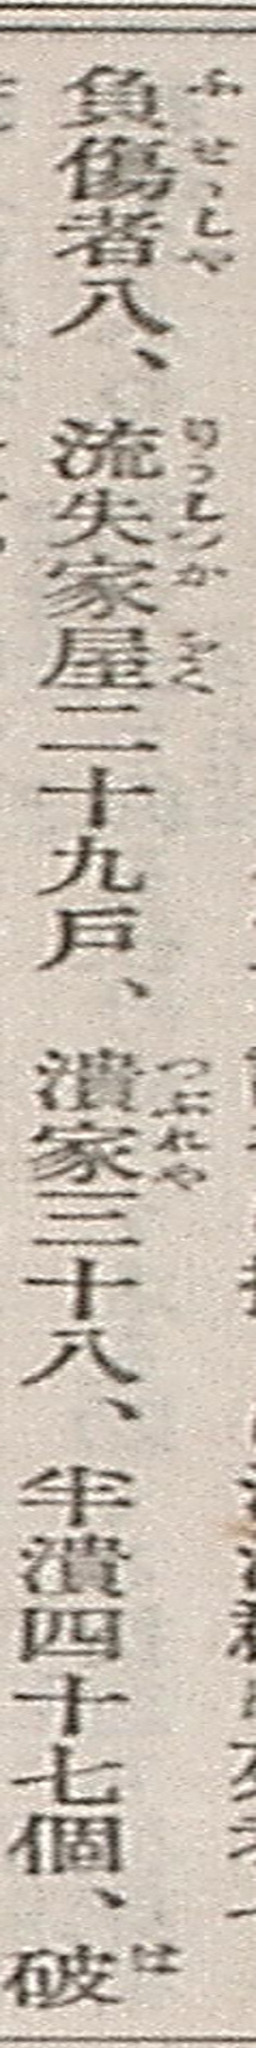負傷者八、流失家屋二十九戸、潰家三十八、半潰四十七個、破
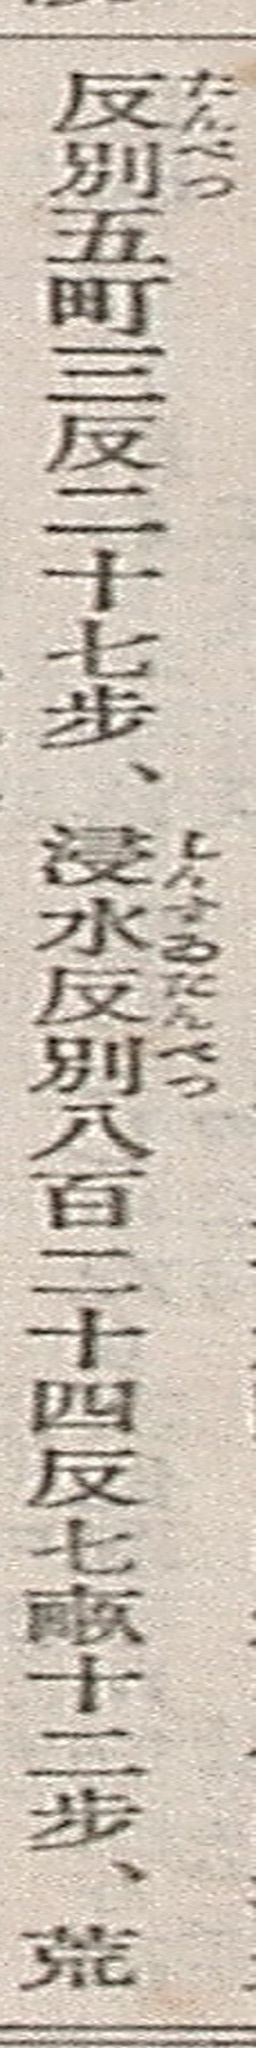反別五町三反二十七歩、浸水反別八百二十四反七畝十二歩、荒
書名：風俗畫報臨時増刊第百二十八號　洪水被害録（下）
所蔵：東京大学地震研究所図書室 Earthquake Research Institute Library, The University of Tokyo, JAPAN
